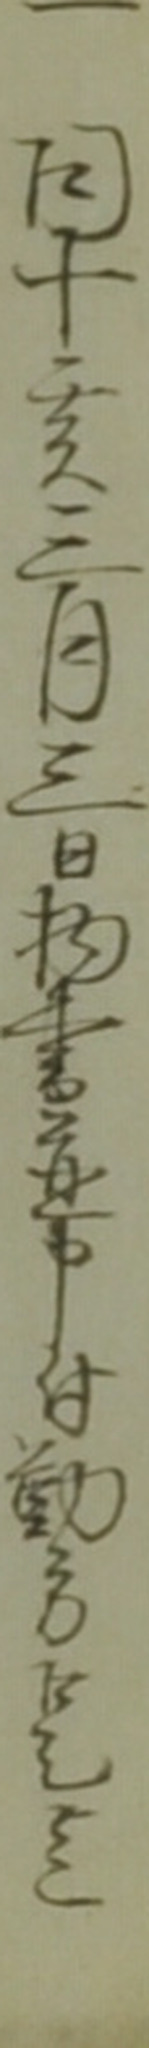一同十亥三月三日物書並申付勤方是迄
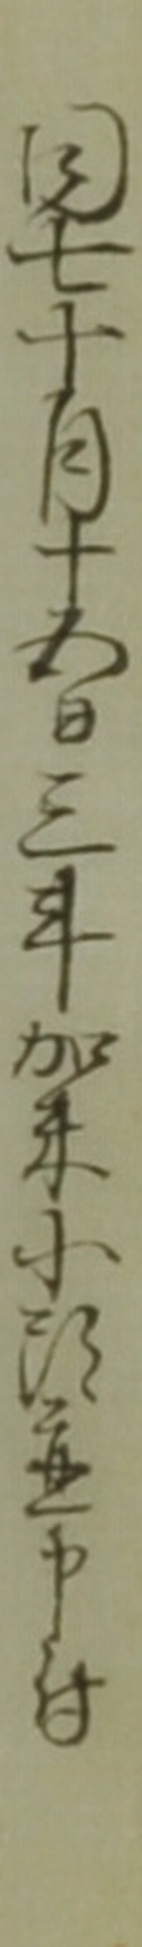同七十月十五日三斗加米小頭並申付
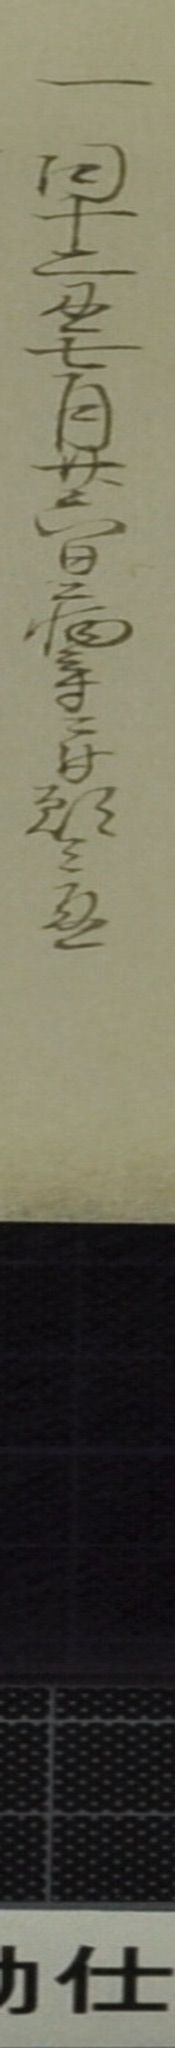一同十二丑七月廿六日病気ニ付願之通
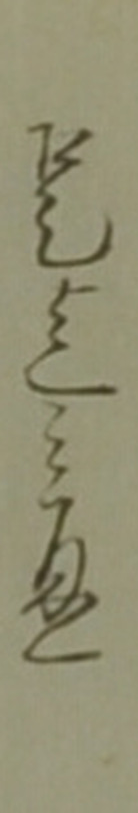是迄之通
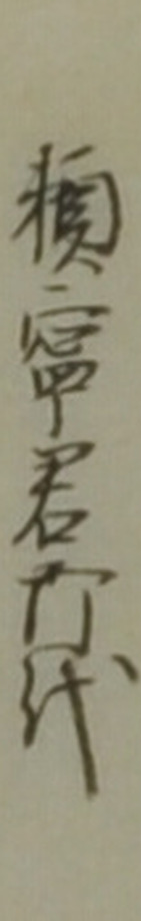頼寧君御代
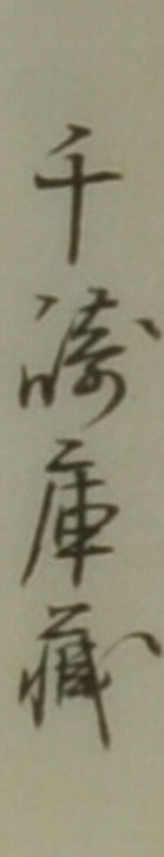千崎庫蔵
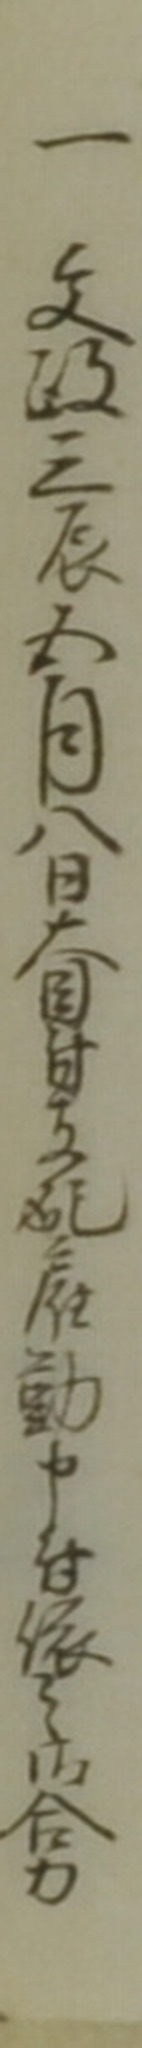一文政三辰五月八日大目付支配雇勤申付依之御合力
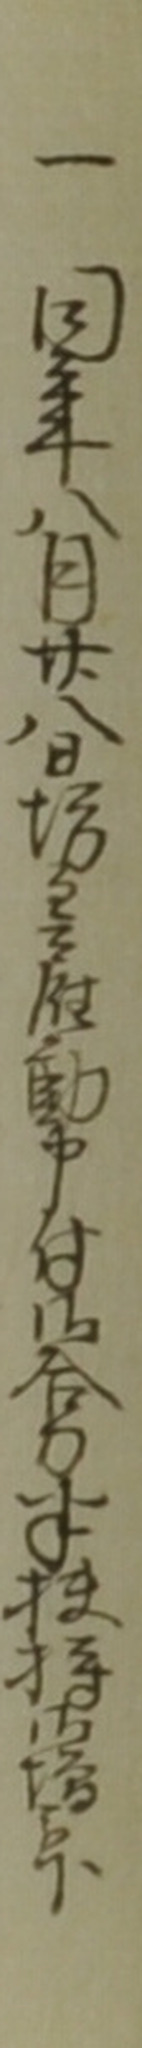一同年八月廿八日坊主雇勤申付御合力半扶持御増被下
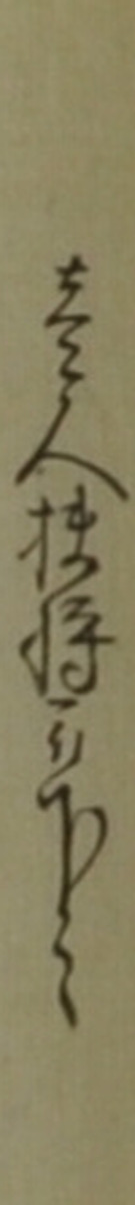壱人扶持被下之
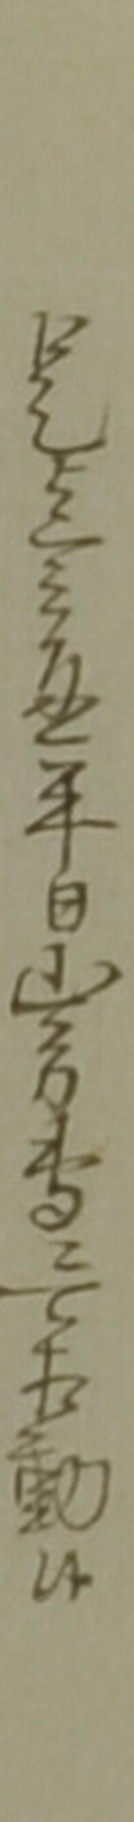是迄之通平日山方専ニ可相勤候
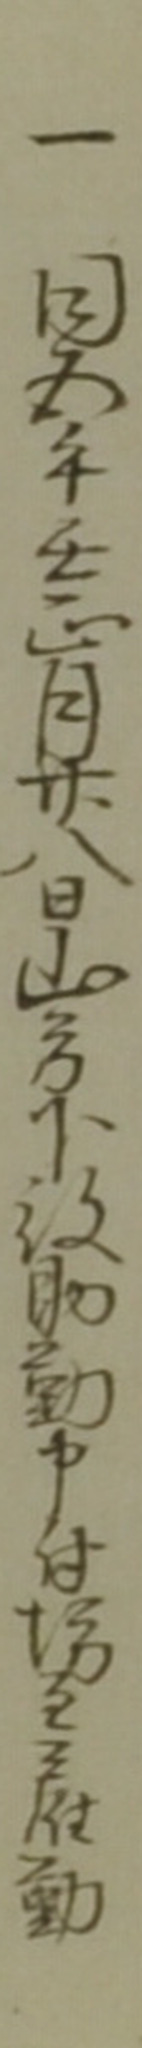一同五午壬正月廿八日山方下役助勤申付坊主雇勤
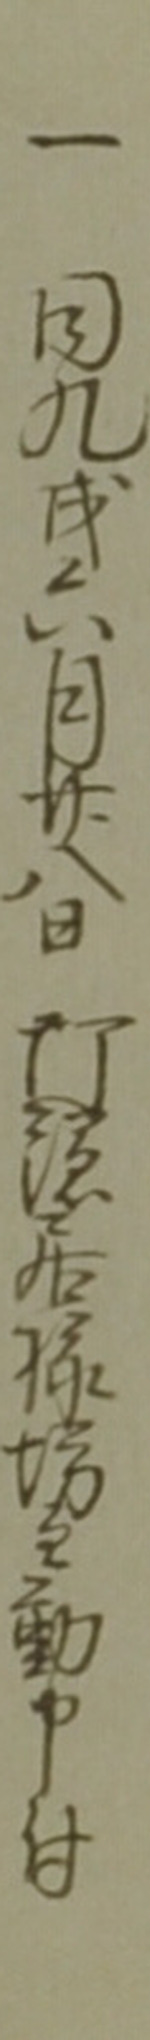一同九戌六月廿八日御隠居様坊主勤申付
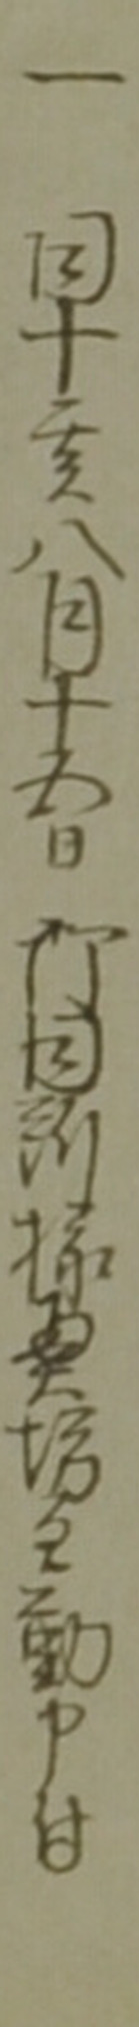一同十亥八月十五日御同所様奥坊主勤申付
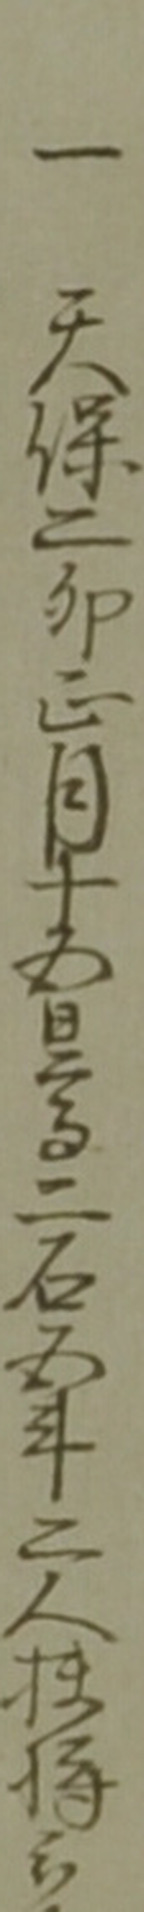一天保二卯正月十五日高岡ニ石五斗二人扶持被下
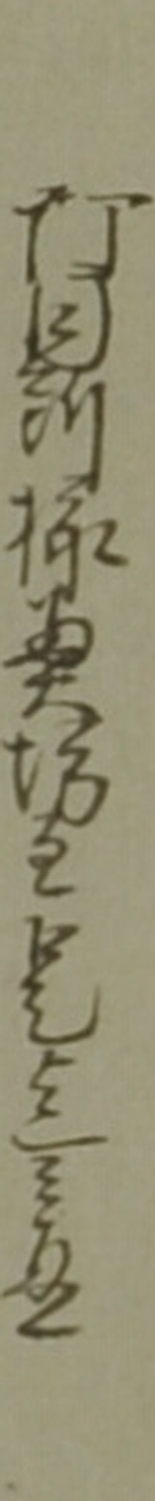御同所様奥坊主是迄之通
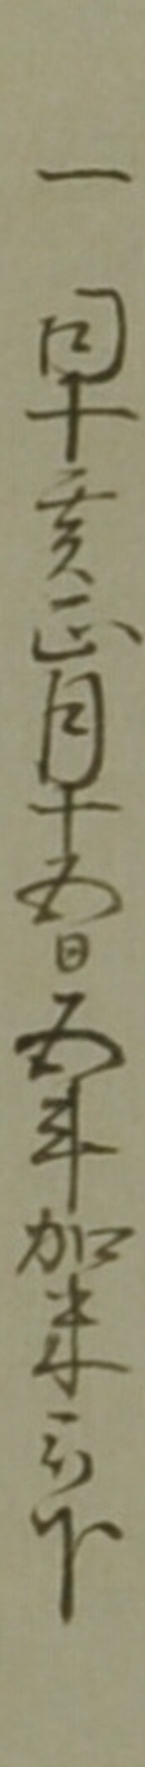一同十亥正月十五日五斗加米被下
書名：無足諸士勤仕録（八）
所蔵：伊那市立高遠町図書館・合同会社AMANE
